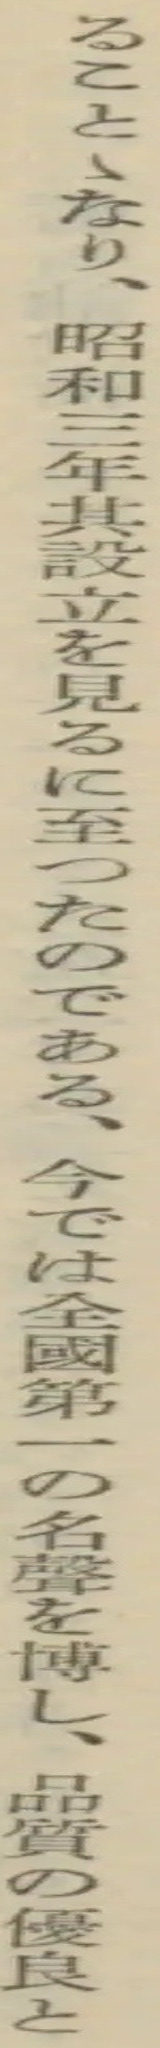ることゝなり、昭和三年其設立を見るに至つたのである、今では全国第一の名声を博し、品質の優良と
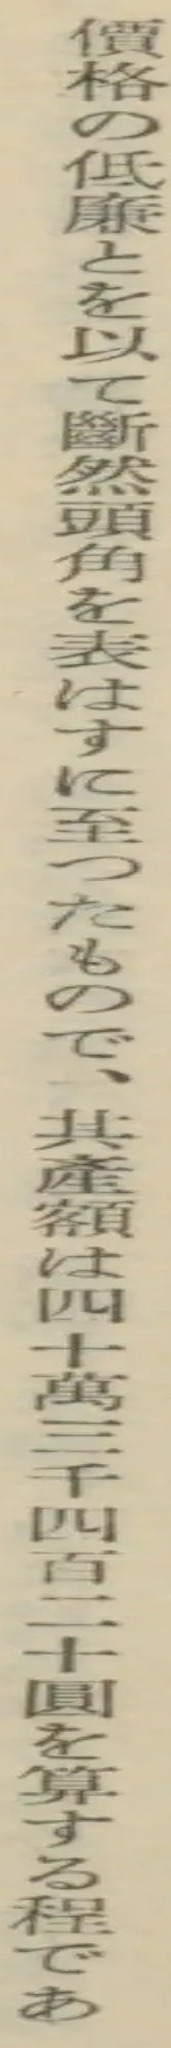価格の低廉とを以て断然頭角を表はすに至つたもので、其産額は四十万三千四百二十円を算する程であ
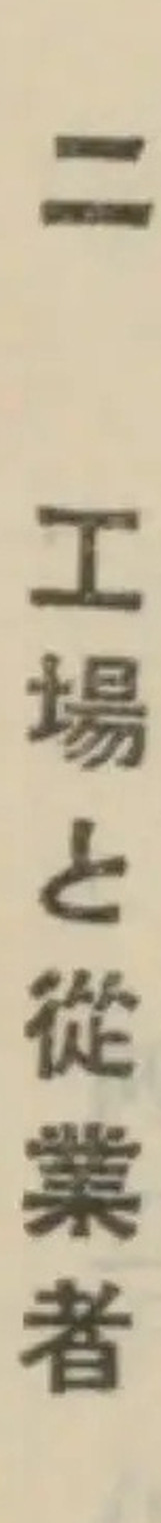二工場と従業者
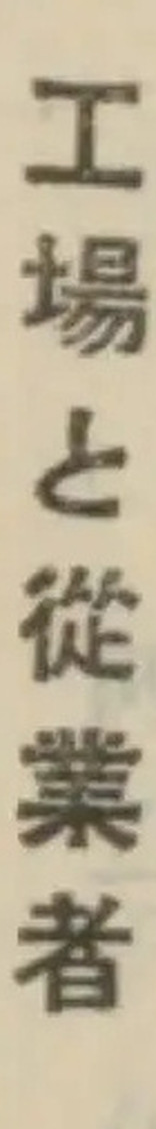二工場と従業者
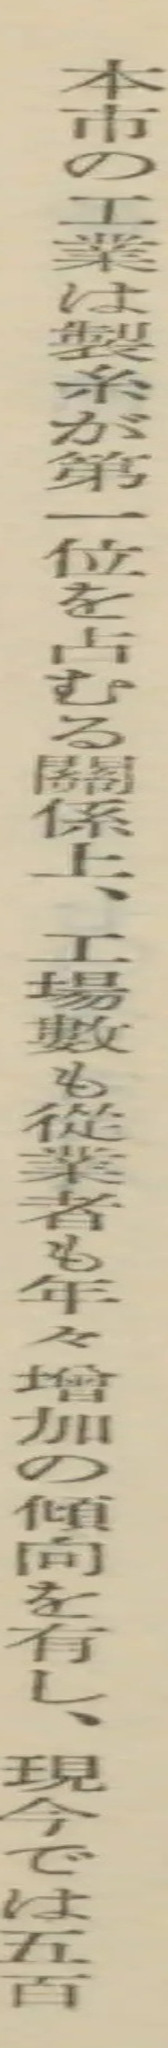本市の工業は製糸が第一位を占むる関係上、工場数も従業者も年々増加の傾向を有し、現今では五百
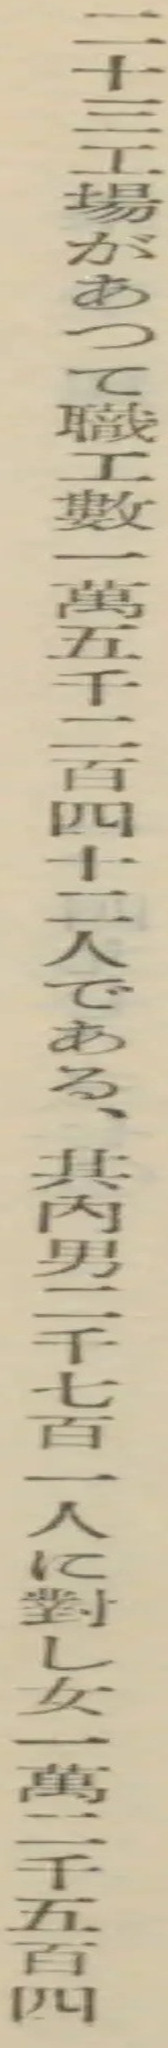二十三工場があつて職工数一万五千二百四十二人である、其内男二千七百一人に対し女一万二千五百四
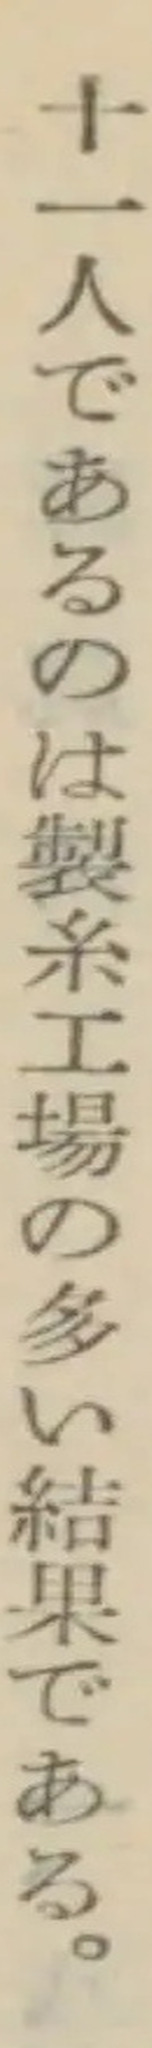十一人であるのは製糸工場の多い結果である。
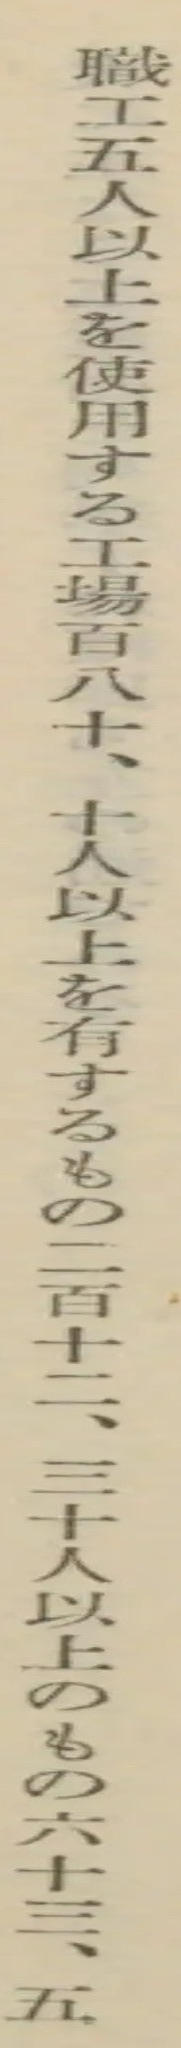職工五人以上を使用する工場百八十、十人以上を有するもの二百十二、三十人以上のもの六十三、五
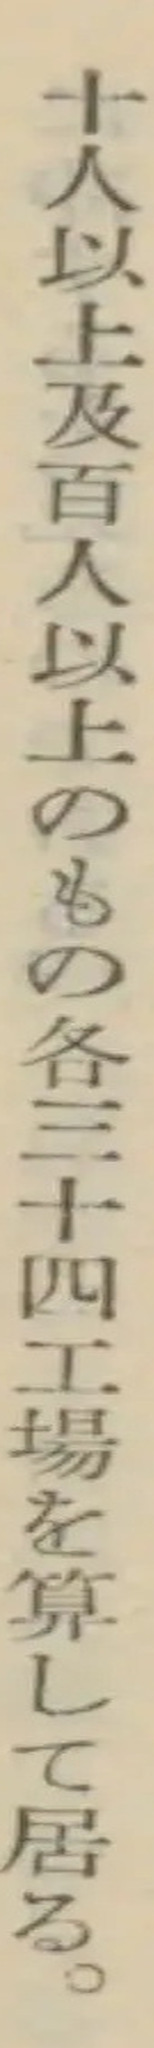十人以上及百人以上のもの各三十四工場を算して居る。
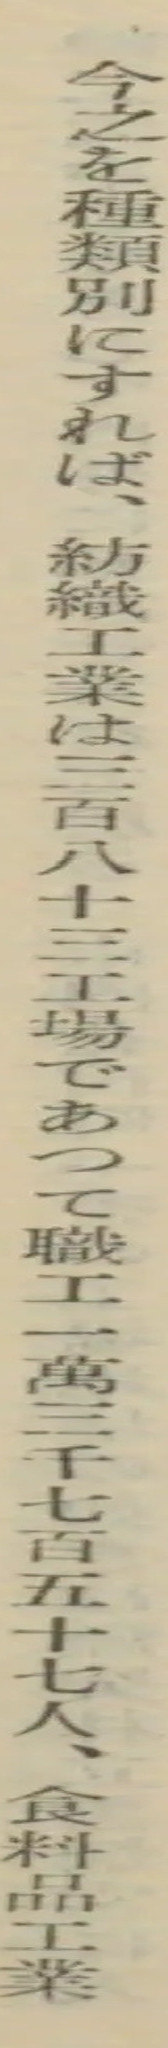今之を種類別にすれば、紡績工業は三百八十三工場であつて職工一万三千七百五十七人、食料品工業
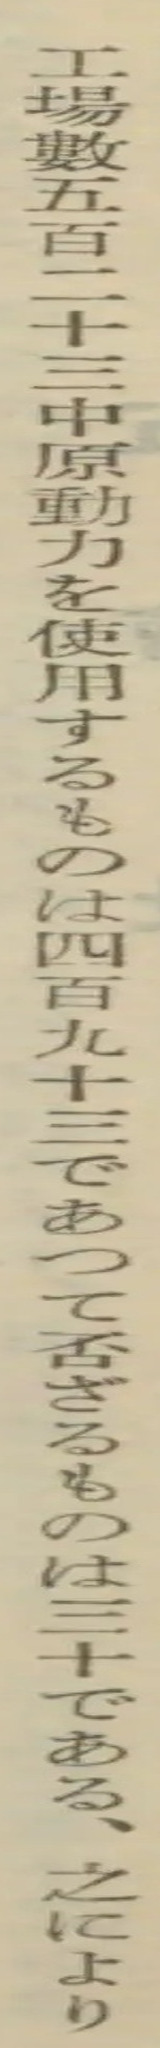工場数五百二十三中原動力を使用するものは四百九十三であつて否ざるものは三十である、之により
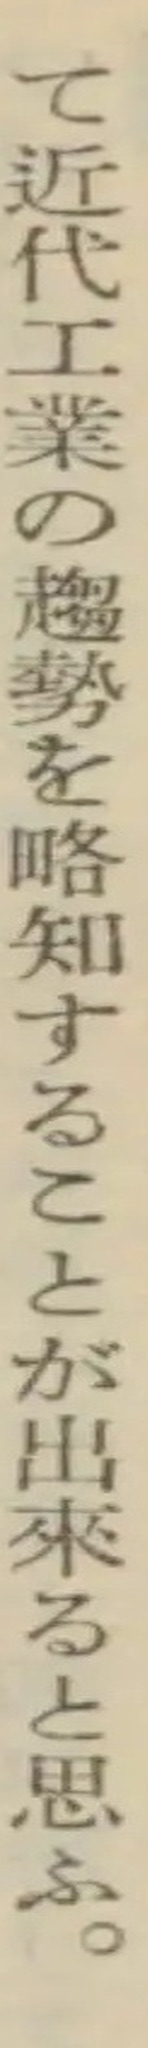て近代工業の趨勢を略知することが出来ると思ふ。
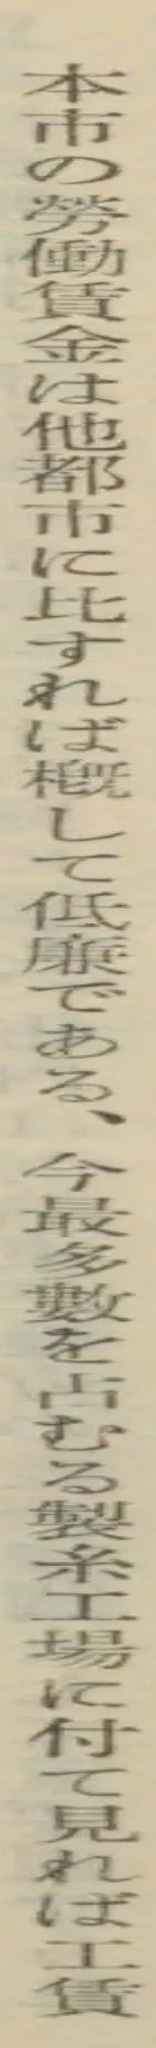本市の労働賃金は他都市に比すれば概して低廉である、今最多数を占むる製糸工場に付て見れば工賃
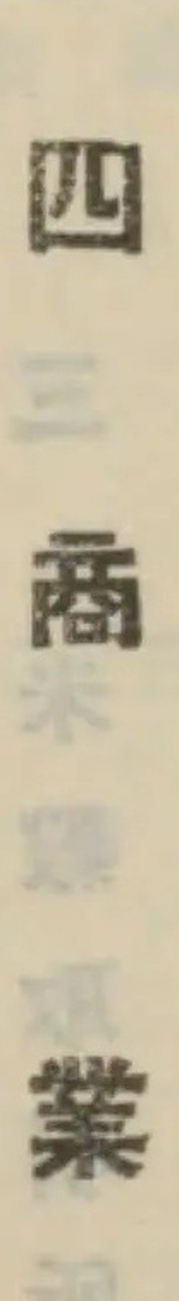四商業
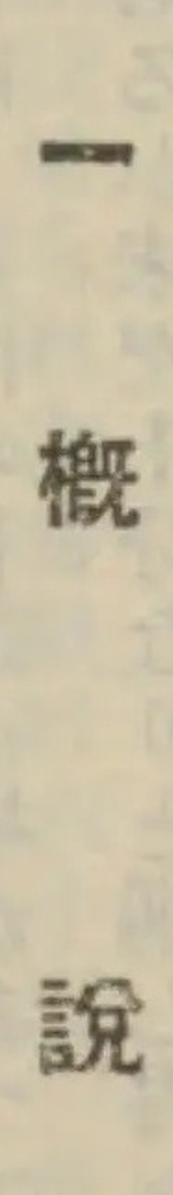一概説
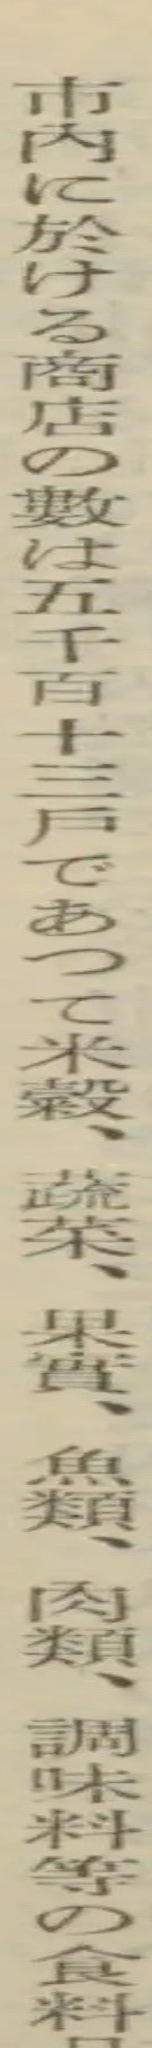市内に於ける商店の数は五千百十三戸であつて米穀、蔬菜、果実、魚類、肉類、調味料等の食料品を
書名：産業の豊橋
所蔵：国立国会図書館 National Diet Library, JAPAN
